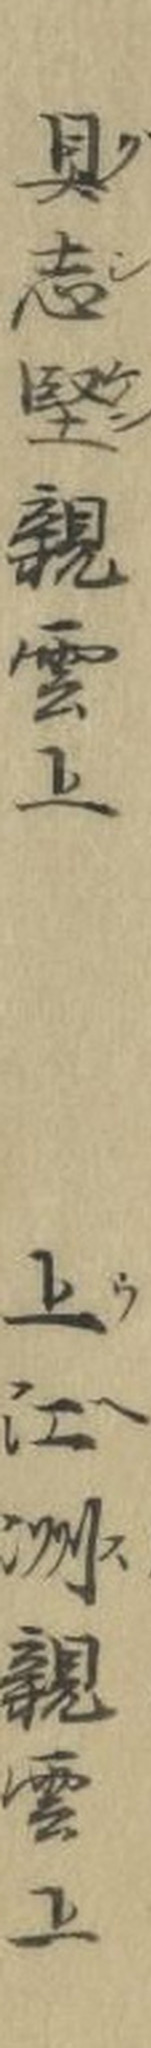具志堅親雲上上江洲親雲上
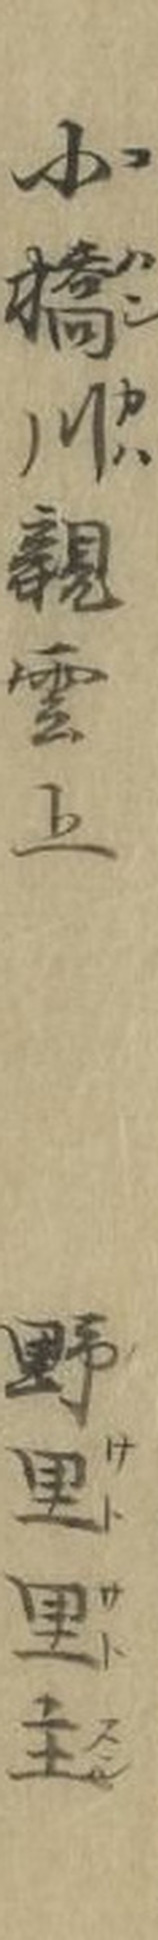小橋川親雲上野里里主
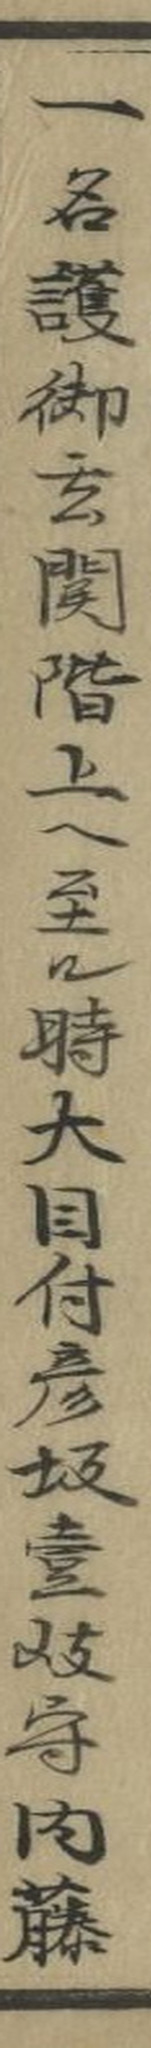一名護御玄関階上へ至ル時大目付彦坂壱岐守内藤

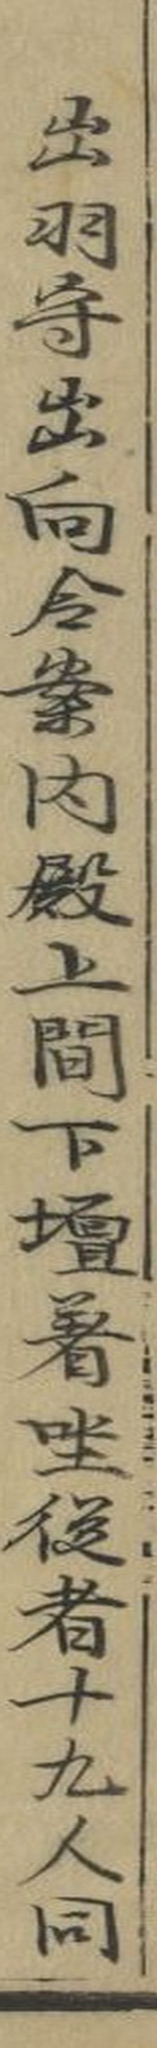出羽守出向令案内殿上間下壇着坐従者十九人同
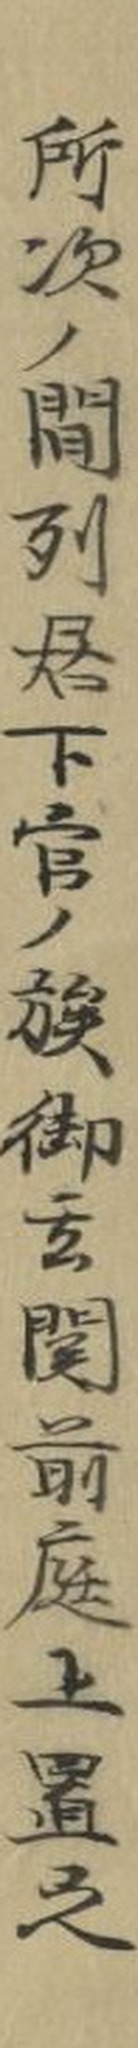所次ノ間列居下官ノ族御玄関前庭上置之
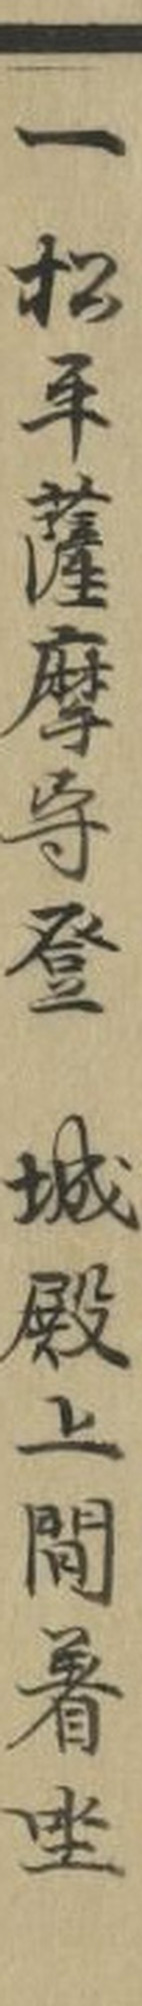一松平薩摩守登城殿上間着座
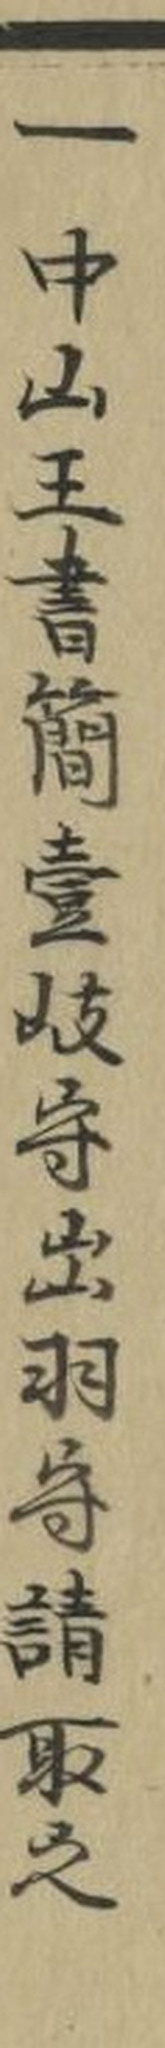一なｋ中山王書簡壱岐守出羽守請取之
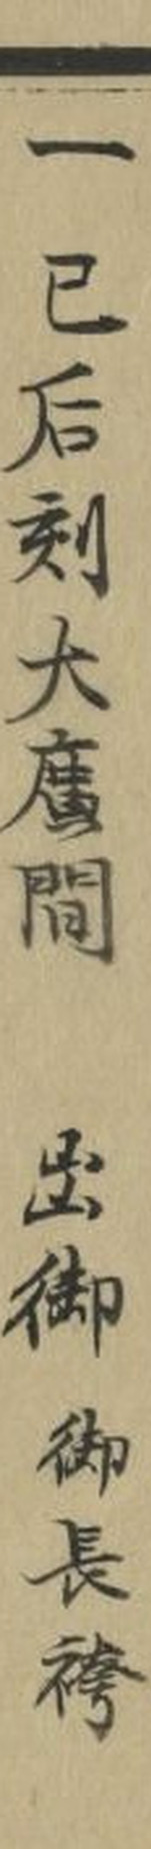一巳后刻大広間出御御長袴
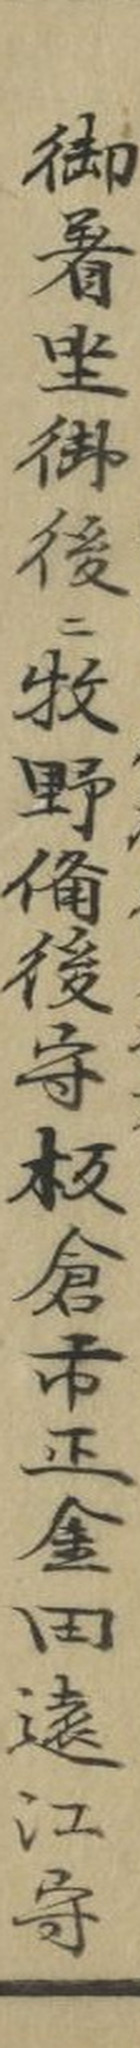御着坐御後ニ牧野備後守板倉市正金田遠江守
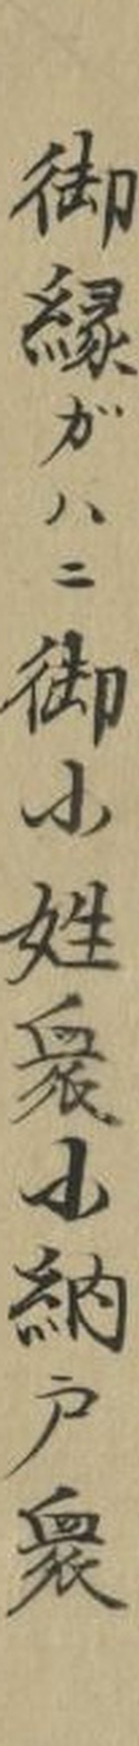御縁ガハニ御小姓衆小納戸衆
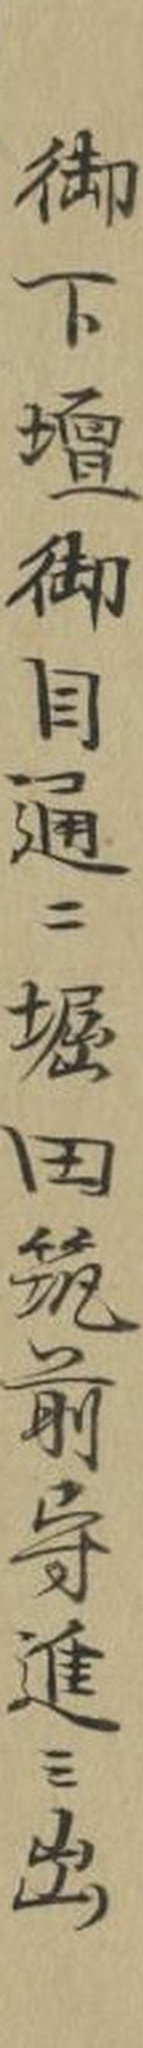御下壇御目通ニ堀田筑前守進ミ出
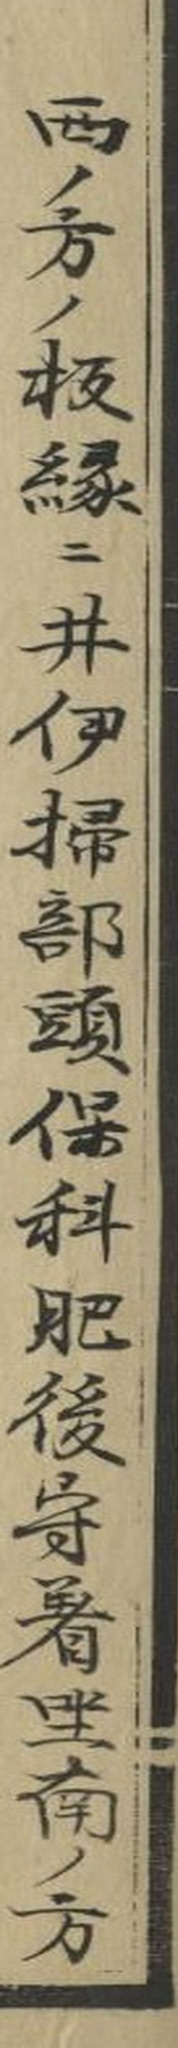西ノ方板縁ニ井伊掃部頭保科肥後守着坐南ノ方
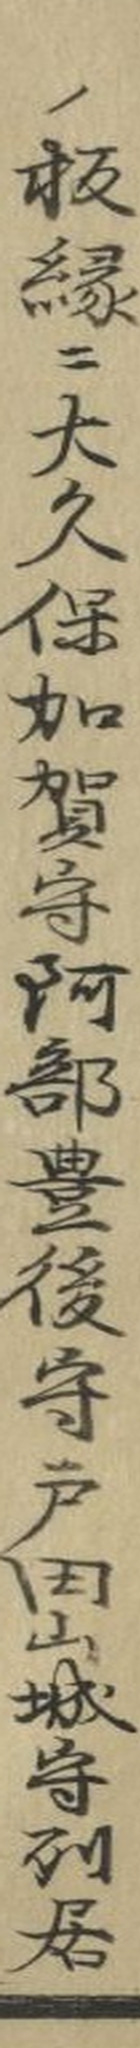ノ板縁ニ大久保加賀守阿部豊後守戸田山城守列居
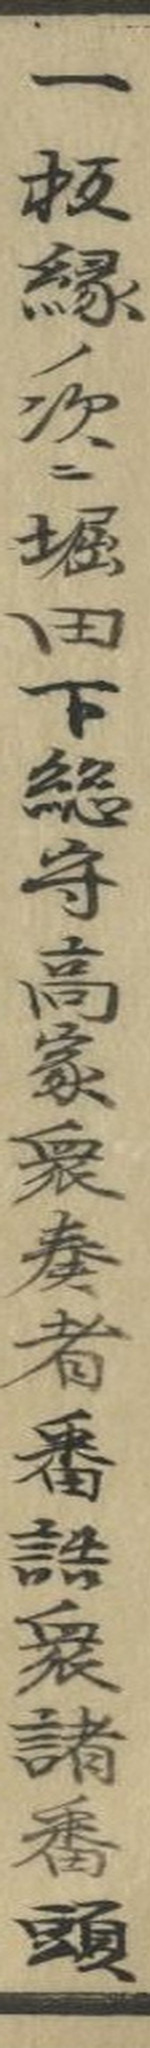一板縁ノ次ニ堀田下総守高家衆奏者番詰衆諸番頭
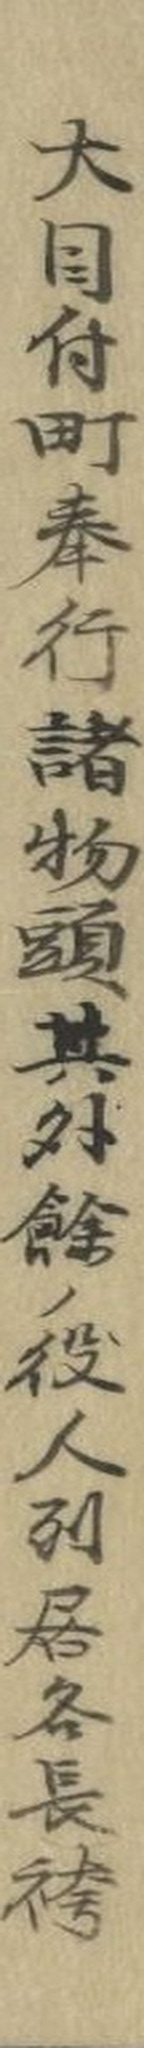大目付町奉行諸物頭其外余ノ役人列居各長袴
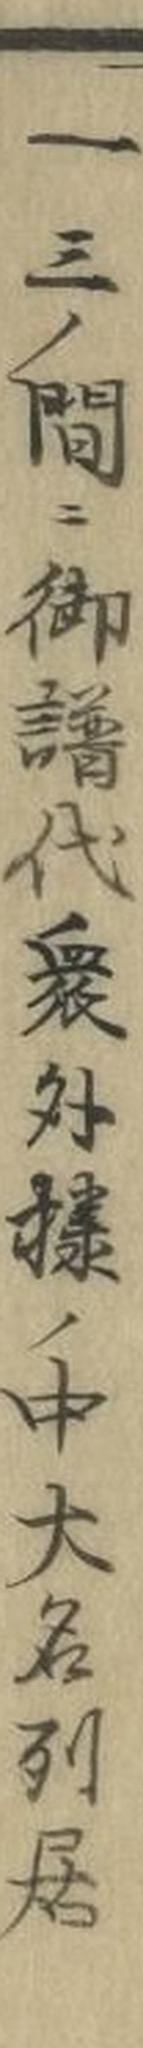一三ノ間ニ御譜代衆外様ノ中大名列居
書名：琉球往来（下）
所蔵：University of the Ryukyus Library
